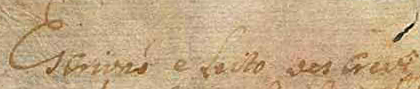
Escrivaõ eLeito o escrevi
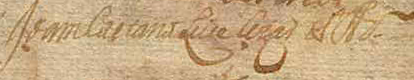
Joam Cartano Leite Cezar de Az.o
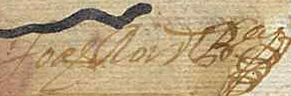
Joaõ Roiz̄ Pra
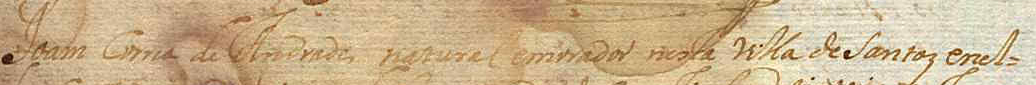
Ioam Correa de Andrade natural e morador nesta Villa de Santos e nel
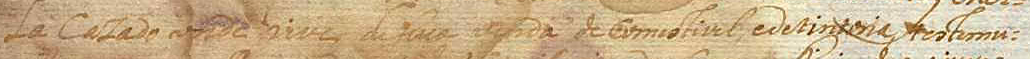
La Cazado onde vive de sua venda de comestivel, e de tintoria, testemu
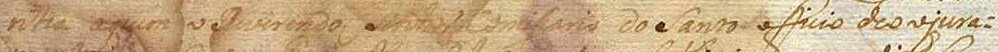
nha a quem o Reverendo senhor Comissario do Santo officio deo o jura
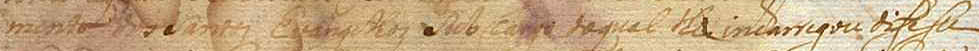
mento dos Santos Euangelhos sob cargo do qual lhe incarregou disesse
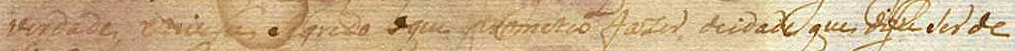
verdade, e tivesse segredo o que prometeo fazer de idade que disse ser de
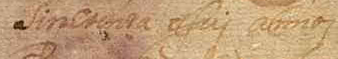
sincoenta e seis annos.
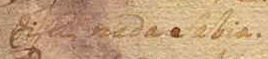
disse nada sabia.
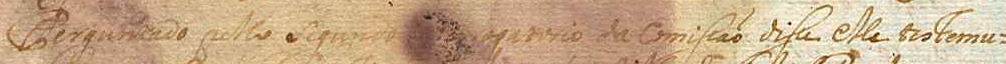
Perguntado pello segundo rogatorio da Comissaõ disse elle testemu
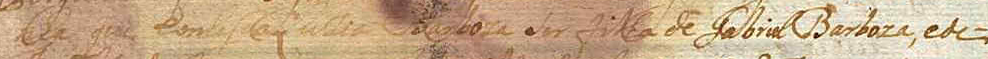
nha que Conhesse a Luzia Barboza ser filha de Gabriel Barboza, e de
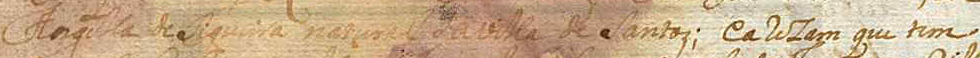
Angella de Siqueira natural da villa de Santos; e a Rezam que tem
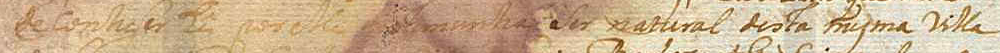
de conheser hé por ella temunha ser natural desta mesma Villa
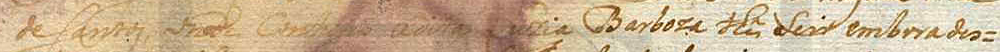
de santos onde Con a ditta Luzia Barboza thê Se ir embora des
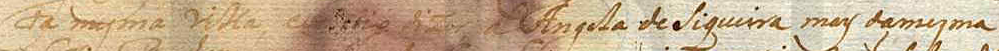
ta mesma Villa, e _io dizer a Angela de Siqueira may da mesma
